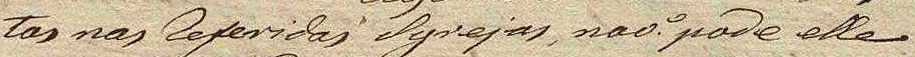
tas nas Referidas Igrejas, naõ pode elle
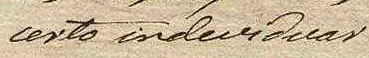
certo indeviduar
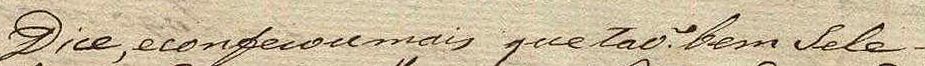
Dice, e confeçou mais que taõbem Sele
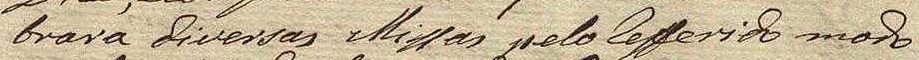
brara diversas Missas pelo Refferido modo
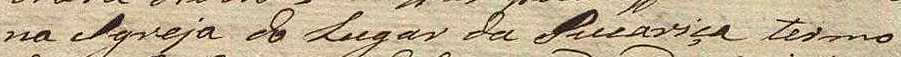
na Igreja do Lugar da Pucariça termo
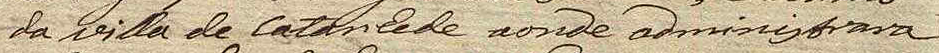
da Villa de catanhede aonde administrara
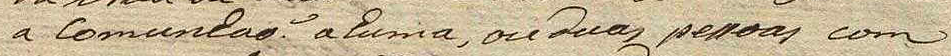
a Comunhaõ a huma, ou duas pessoas com
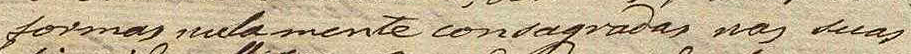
formas nulamente consagradas nas suas
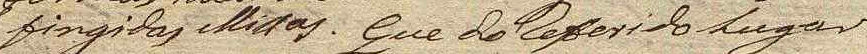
fingidas Missas. Que do Referido Lugar
